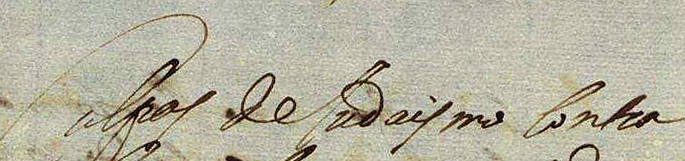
Culpas de Judaismo Contra
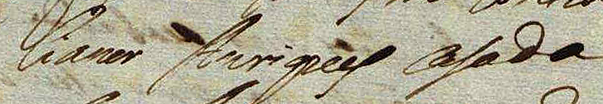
lianor Anriques casada
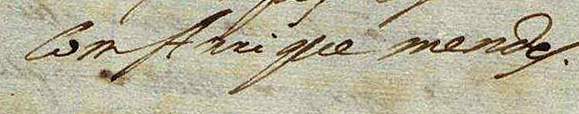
com Anrique mendes.
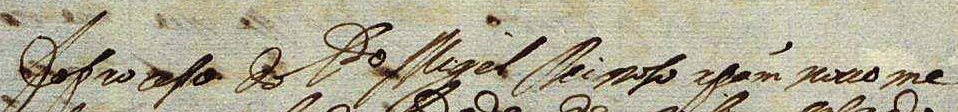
Do proceso do ldo Migel Reinoso xpam̄ nouo me
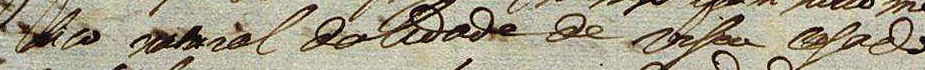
dico natural da Cidade de viseu casado
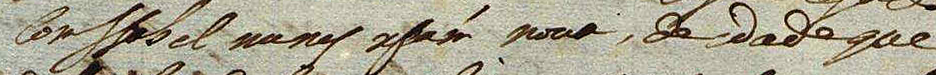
Com Jsabel nunes xpam̄ noua, de idade que
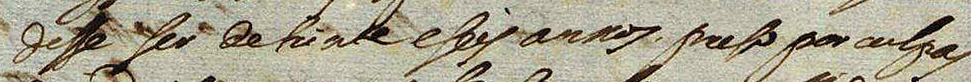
disse ser de trinte e seis annos preso por culpas
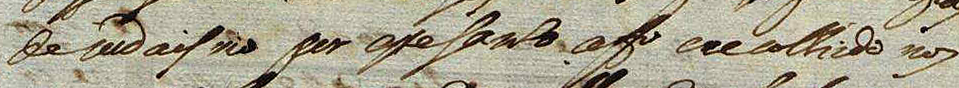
de iudaisno per este santo offo e recolhido nos
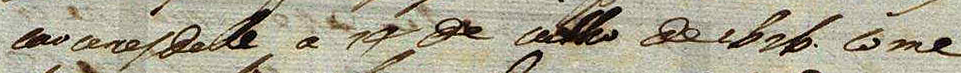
carceres delle a 14 de iulho de 1626. come
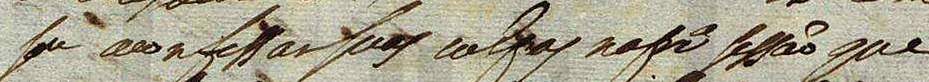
sou a confessar suas culpas na pra sessaõ que
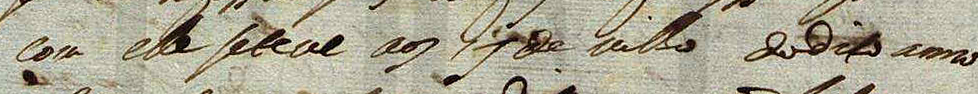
com elle se teue aos 17 de iulho do dito anno
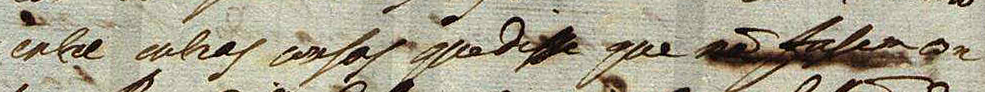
entre outras cousas que disse que nā fasem con
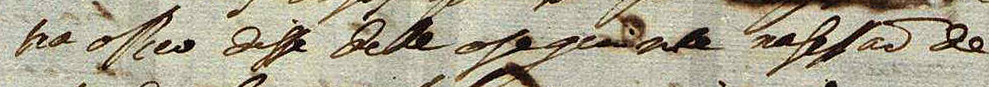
tra o Reo disse delle o seguinte na sessaõ de
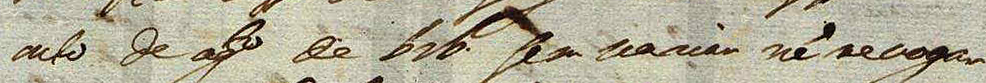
auto de agto de 626. sem uariar nē reuogar
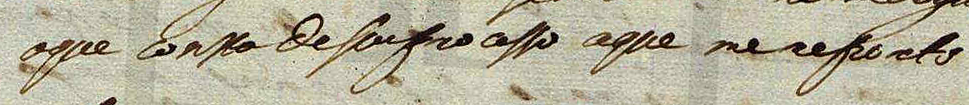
o que consta de seu processo a que me reporto
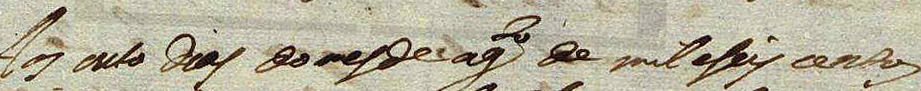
Aos outo dias do mes de agto de mil e seiscentos
